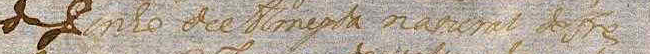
de Pinho de Almeyda natural da fre
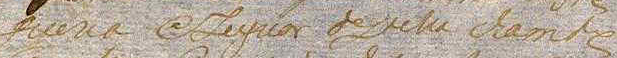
guezia e Luguar de Villa cham de
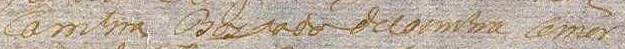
Cambra Bizpado de coimbra comar
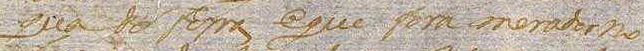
qua da feyra e que fora morador no
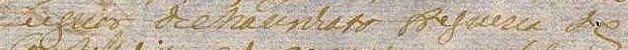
luguar de Macinhata freguezia de
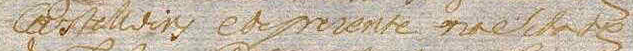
castelloins e de prezente na Sidade
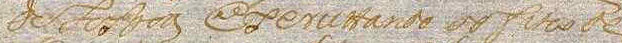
de Lisboa Exercittando o ofiseo de
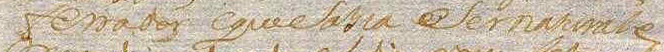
ferrador e que Sabia Ser natural e
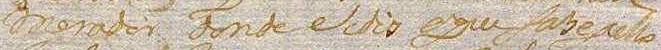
morador donde Se dis e que sabe pello
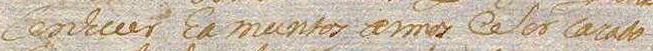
Conhecer ha muntos annos e Ser cazado
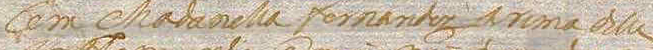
Com Madanella fernandez prima delle
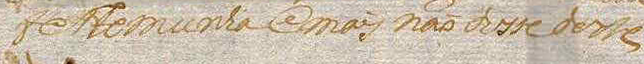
testemunha E mais naõ disse deste
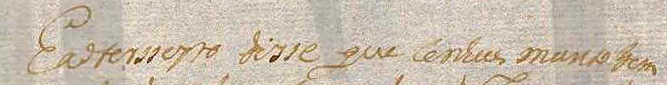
E ao tersseyro disse que Conhece munto bem
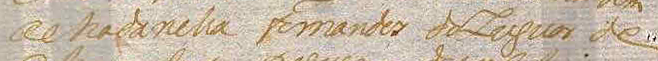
a Madanella fernandes do Luguar de
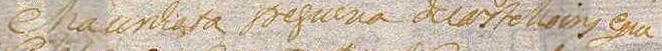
Macinhata freguezia de castelloins que
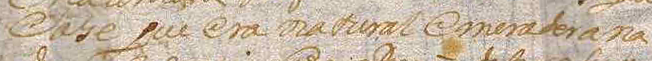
Sabe que era natural e moradora na
